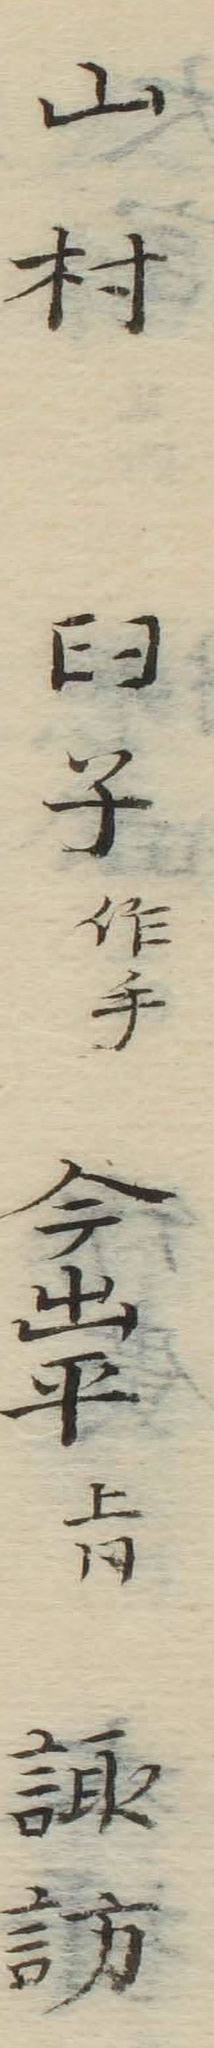山村臼子作手今出平上同諏訪
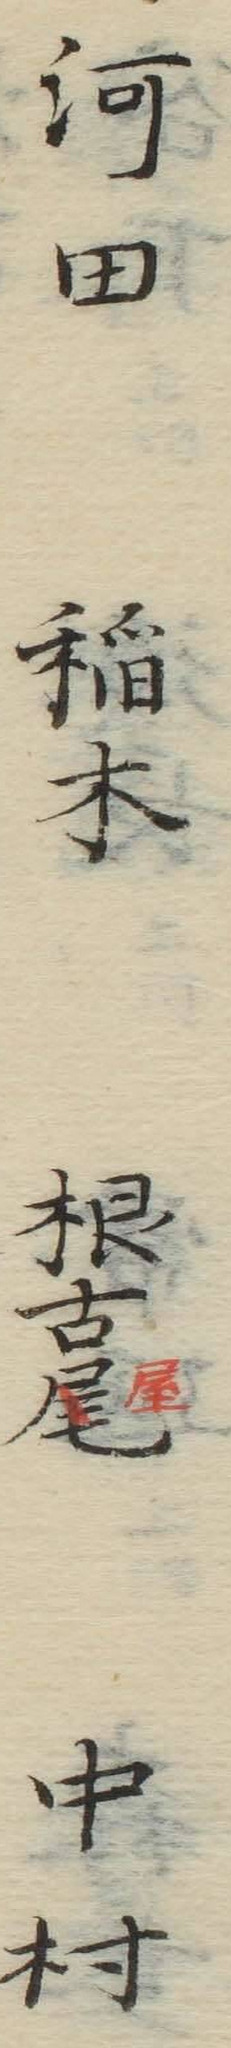河田稲木根古尾屋中村
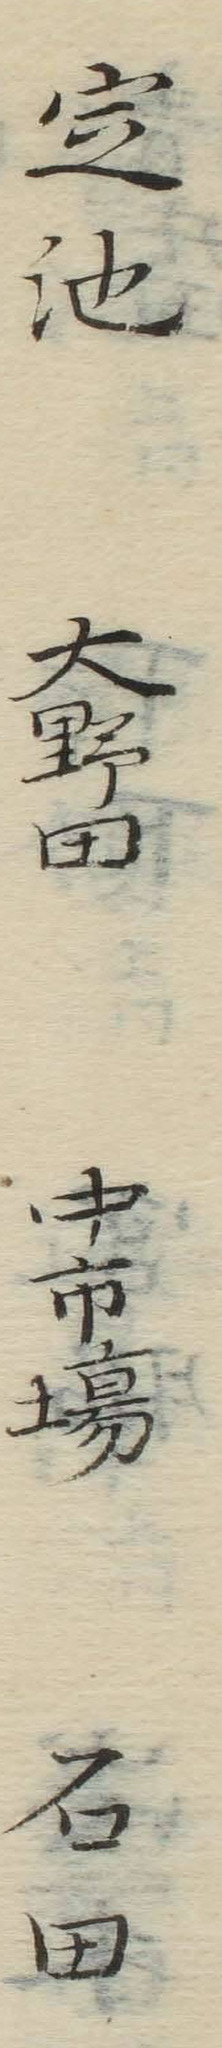定池大野田中市場石田
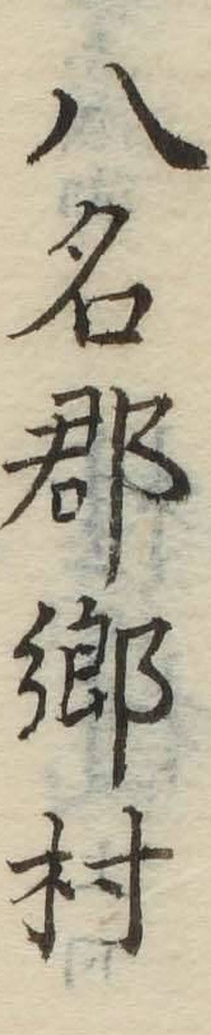八名郡郷村
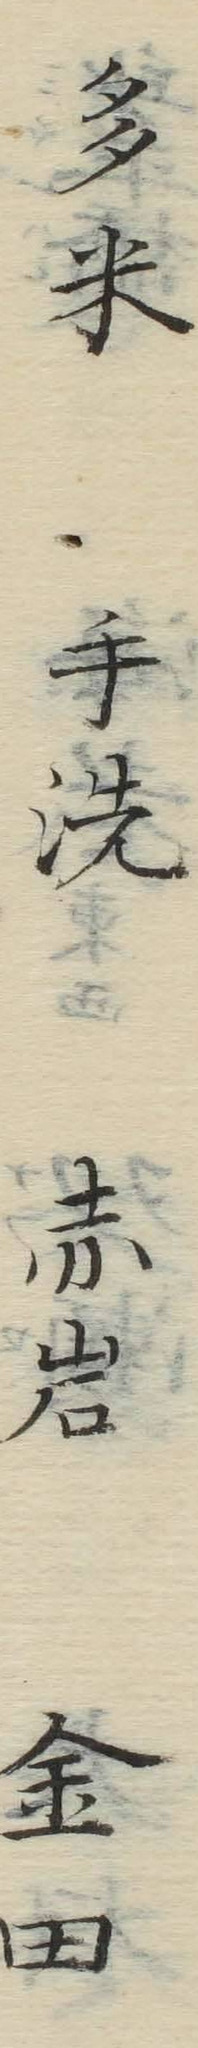多米手洗赤岩金田
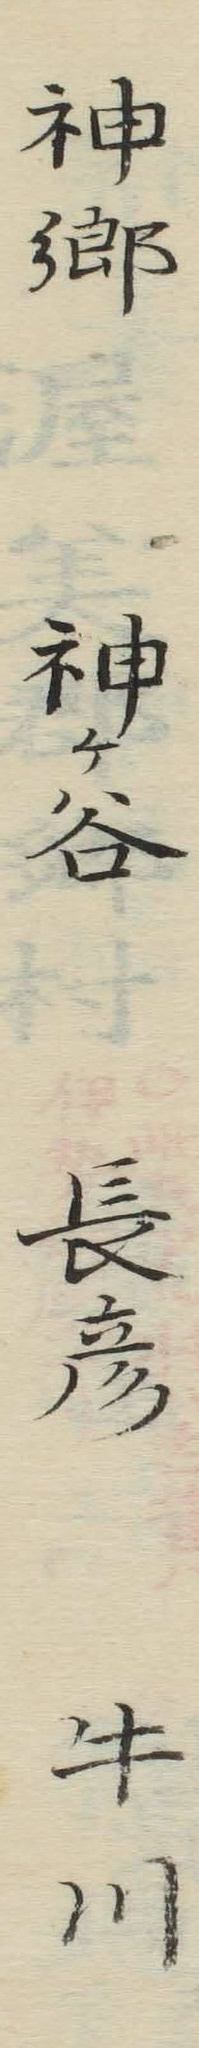神郷神ヶ谷長彦牛川
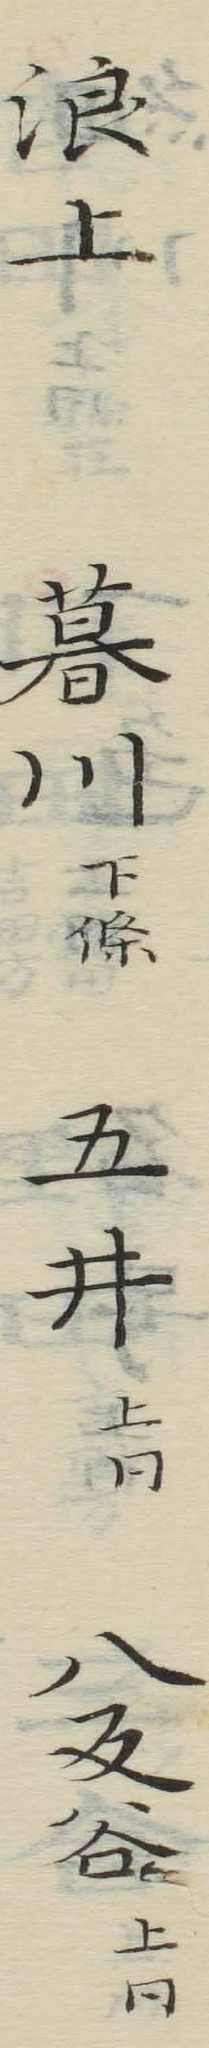浪上暮川下條五井上同八反谷上同
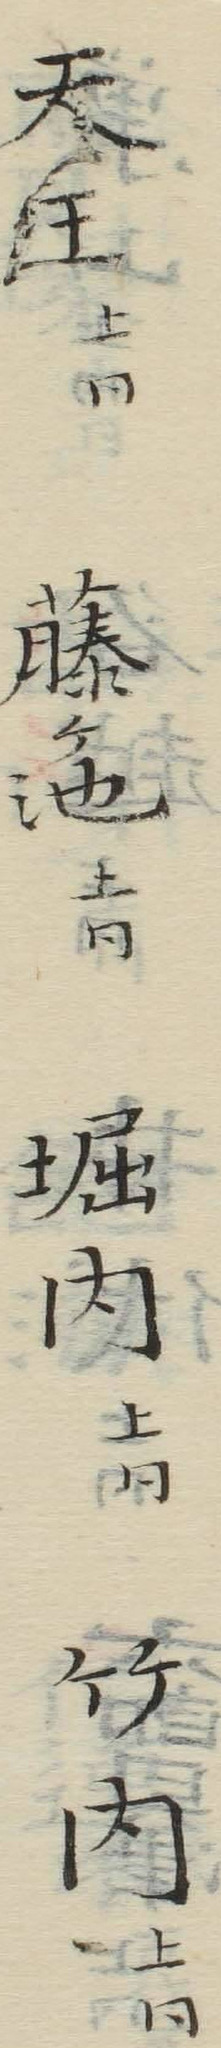天王上同藤ヶ池上同堀内上同竹内上同
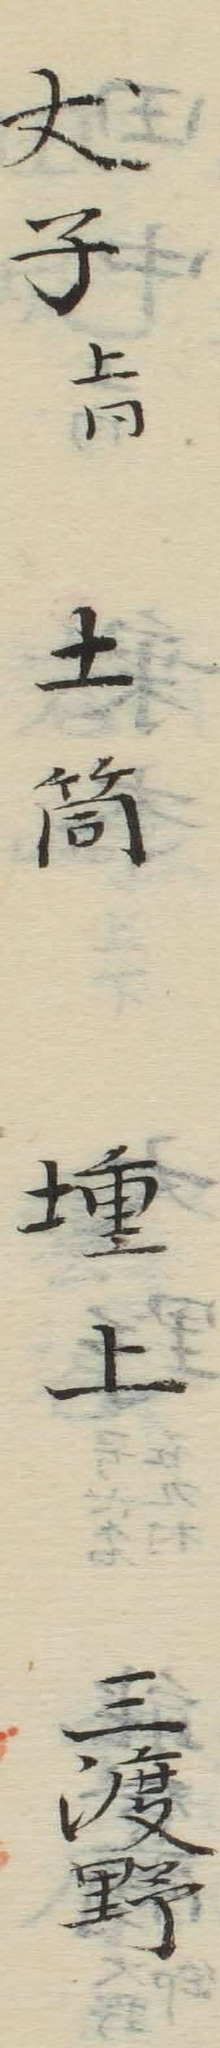犬子上同土筒堹上三渡野
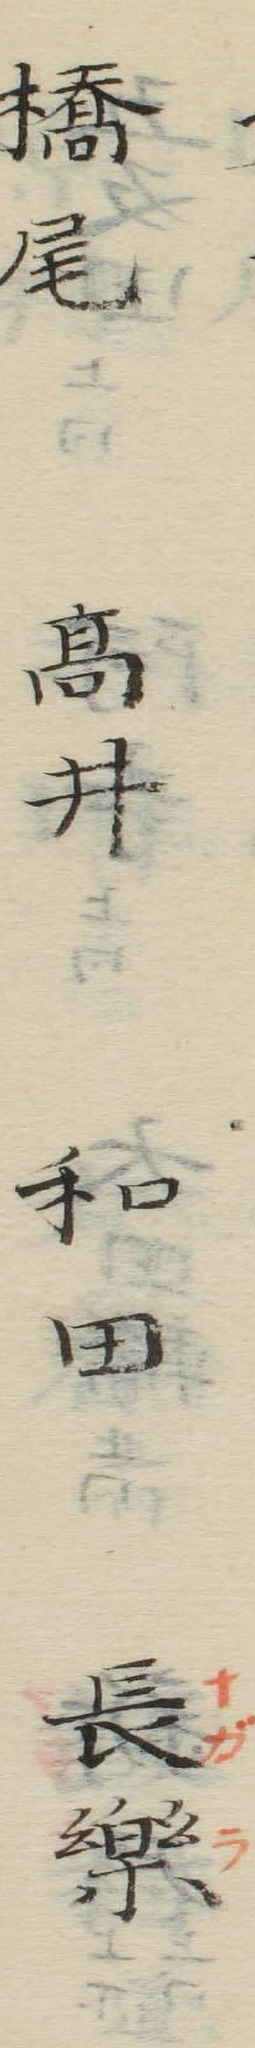橋尾髙井和田長樂
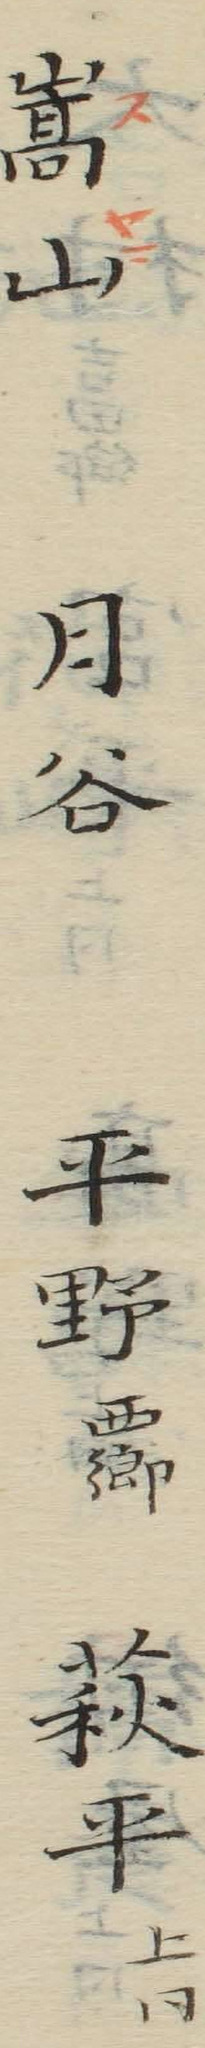嵩山月谷平野西郷萩平上同
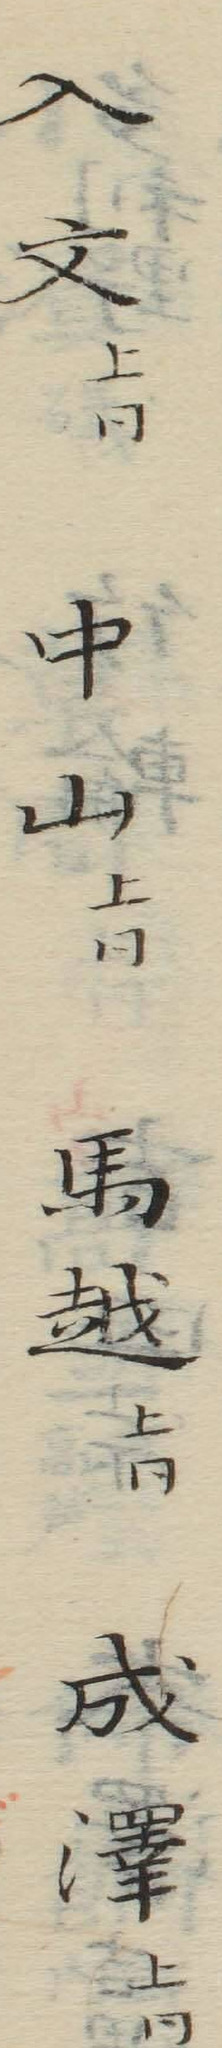入文上同中山上同馬越上同成澤上同

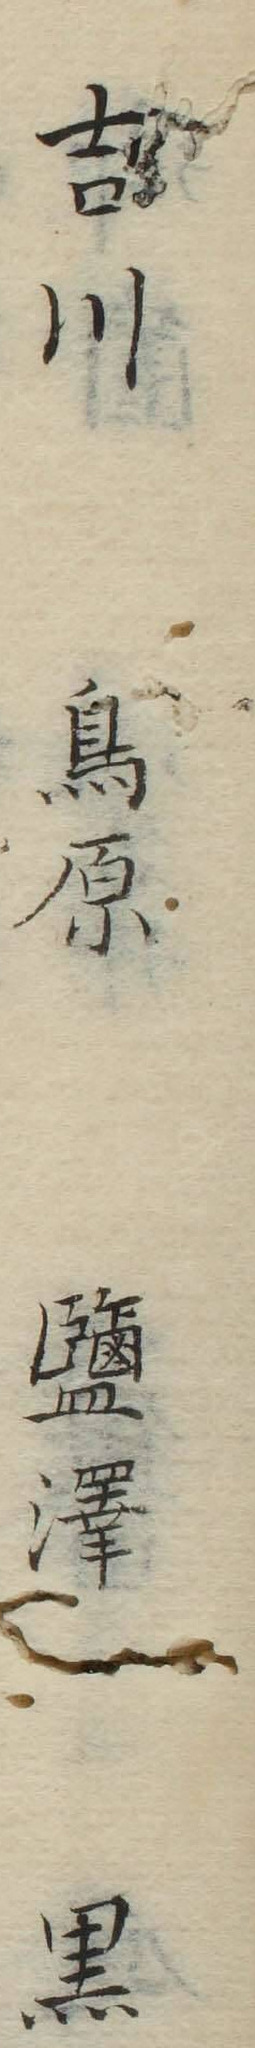吉川鳥原鹽澤黒田
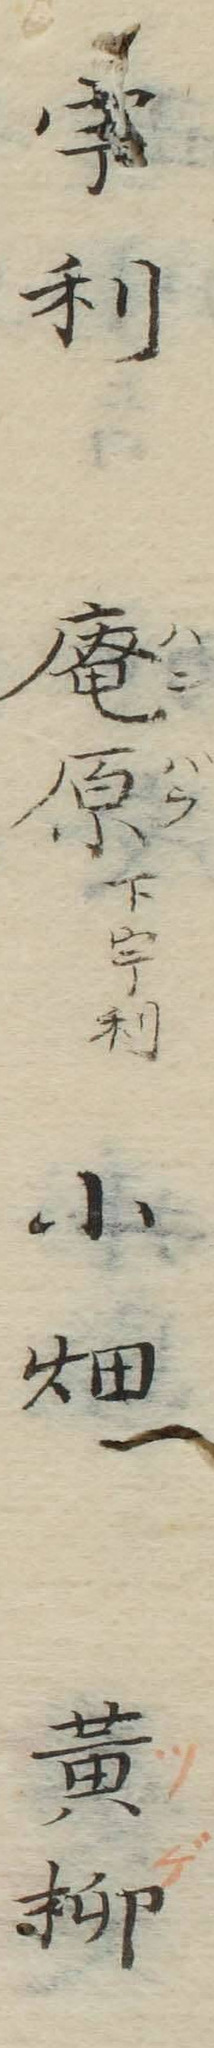宇利庵原下宇利小畑黄柳
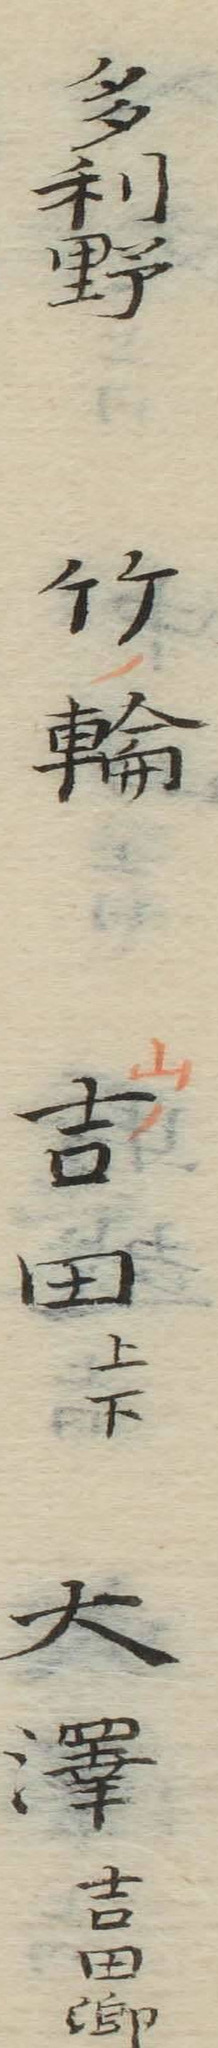多利野竹輪𠮷田上下大澤吉田郷
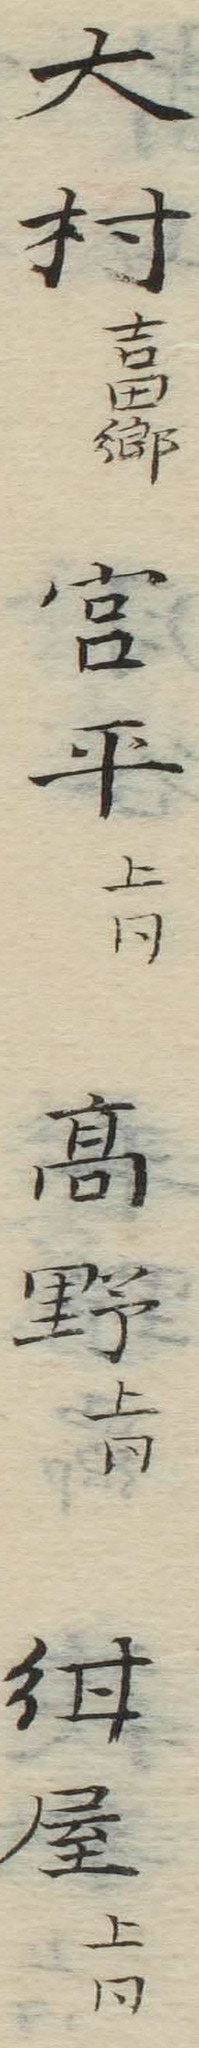大村吉田郷宮平上同髙野上同紺屋上同
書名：三河国二葉松
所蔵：国文学研究資料館
